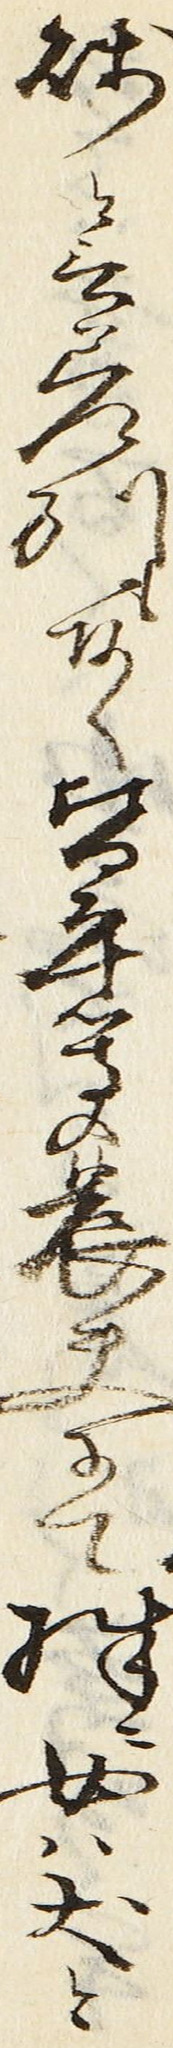賤と言差別もなく皆平等の農夫にて殊ニ女ハ犬と
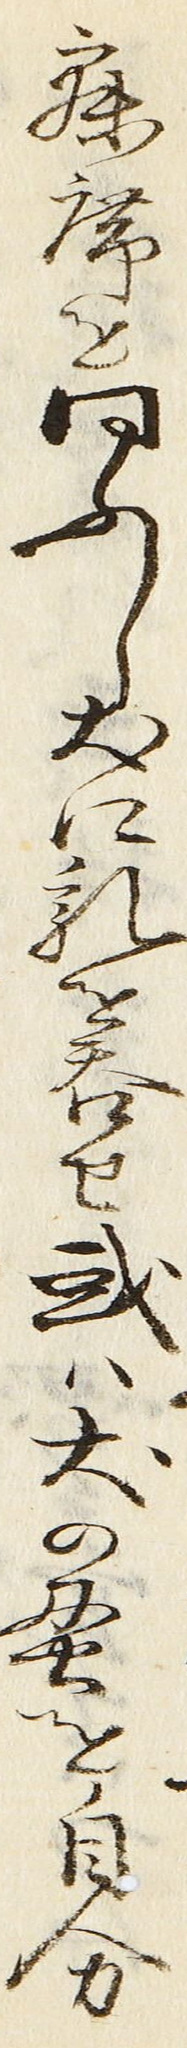寝席を同ふし犬に乳を呑せ或ハ犬の蚤を自分
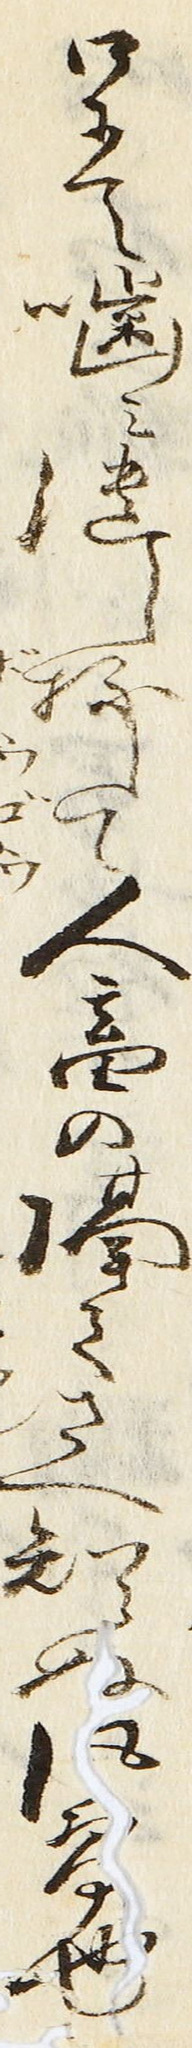口にて噛ミ潰し抔して人畜の隔てさへ知らぬ風習也
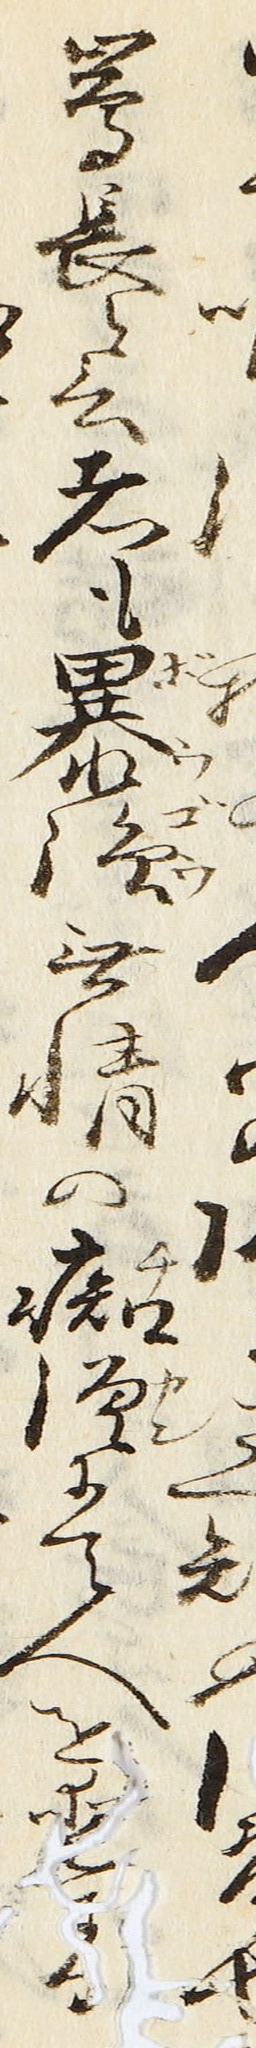島長と言者も暴強無情の痴僧にて人を愛する
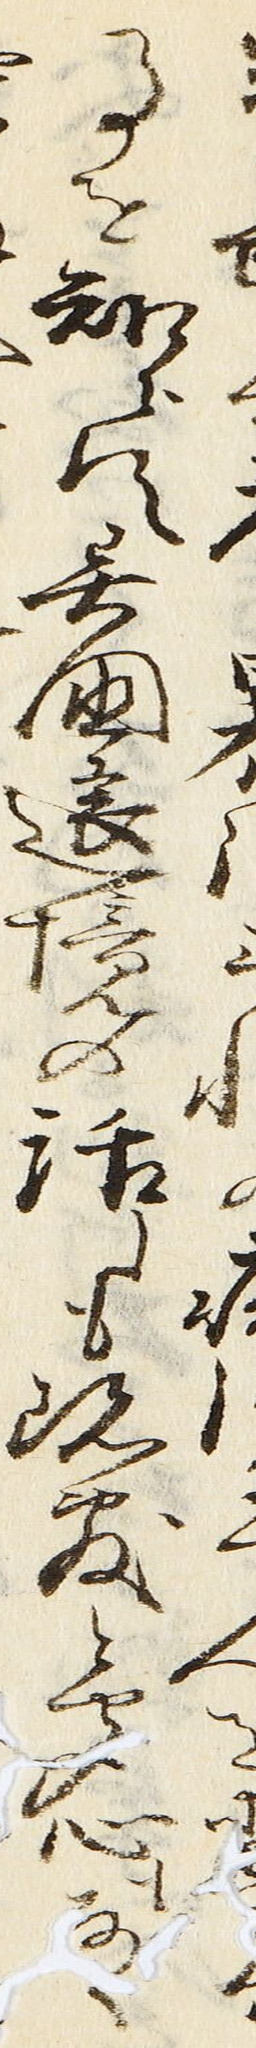事を知らす異国遠境の話しも珍敷と聞心もなく
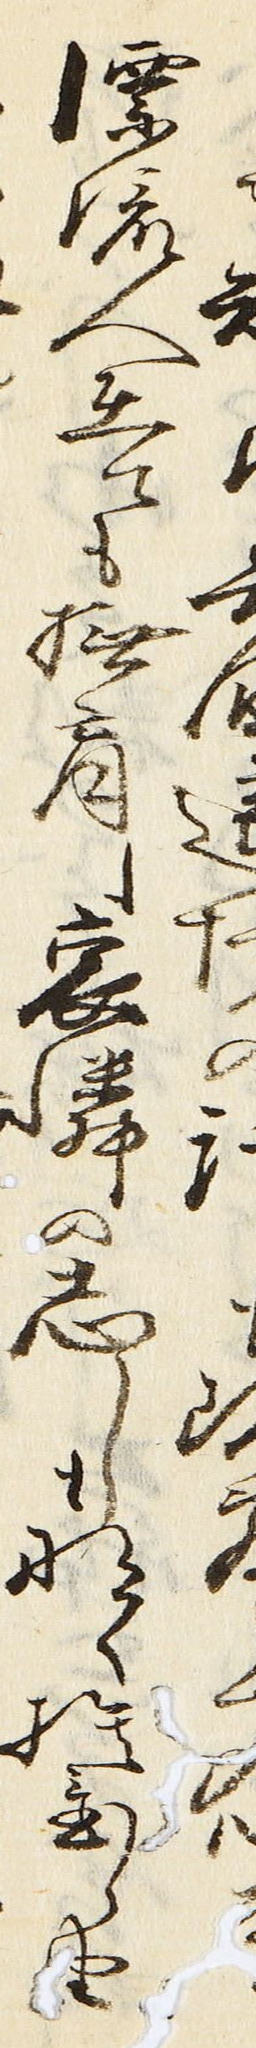漂流人在ても撫育し哀憐の志しもなく捨置候由
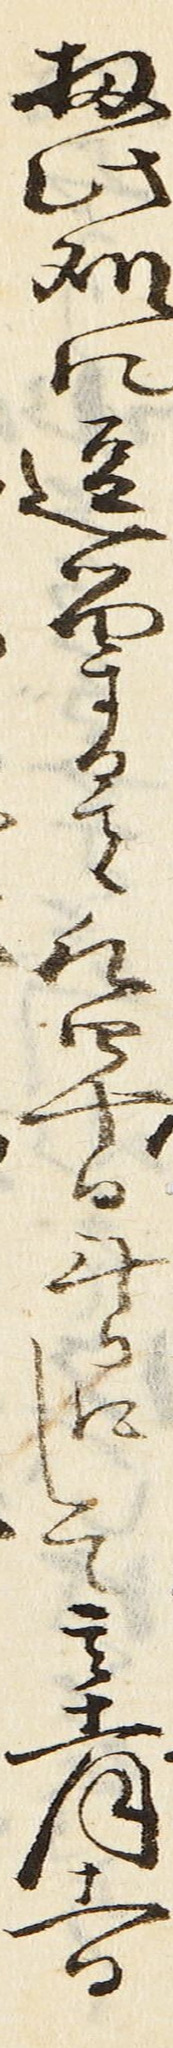扨此処に逗留すること凡四十日計りにして其十一月十一日
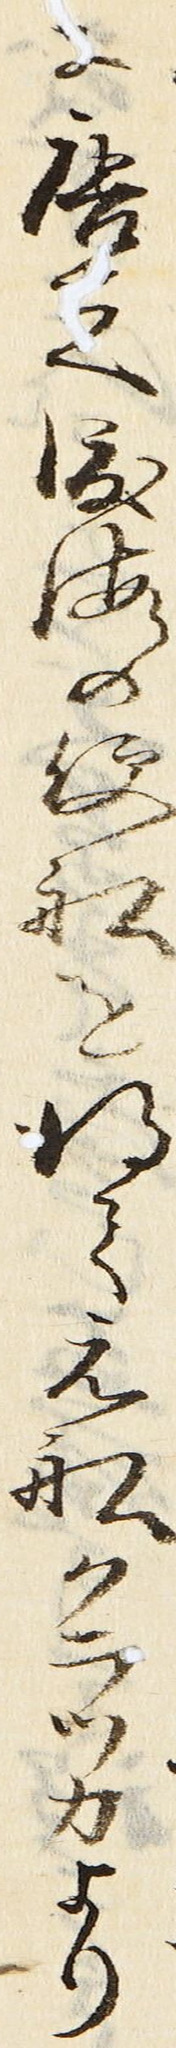に唐土へ渡海の便船を得て元船クラツカより
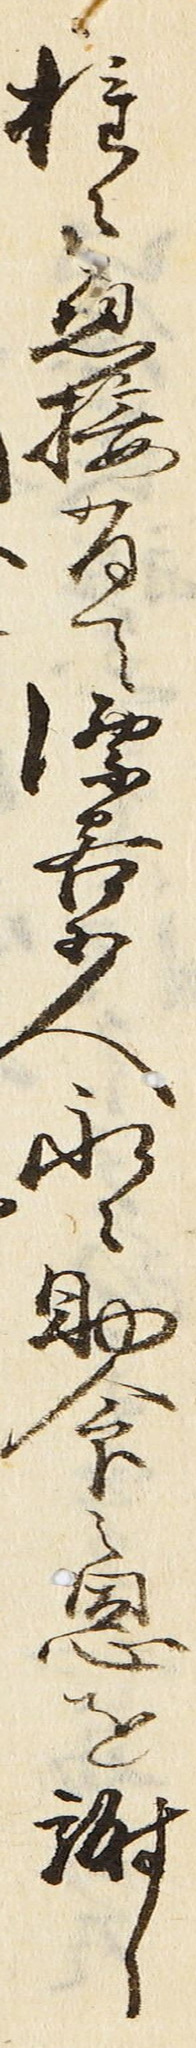権ニ応接有て漂客五人永々助命の恩を謝し
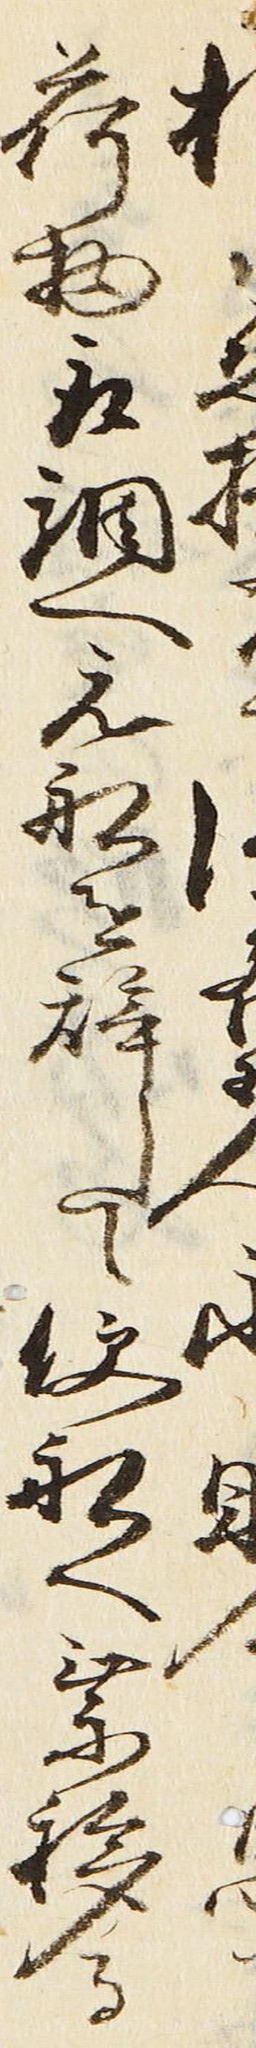荷物取調へ元船を辞して便船へ乗移る
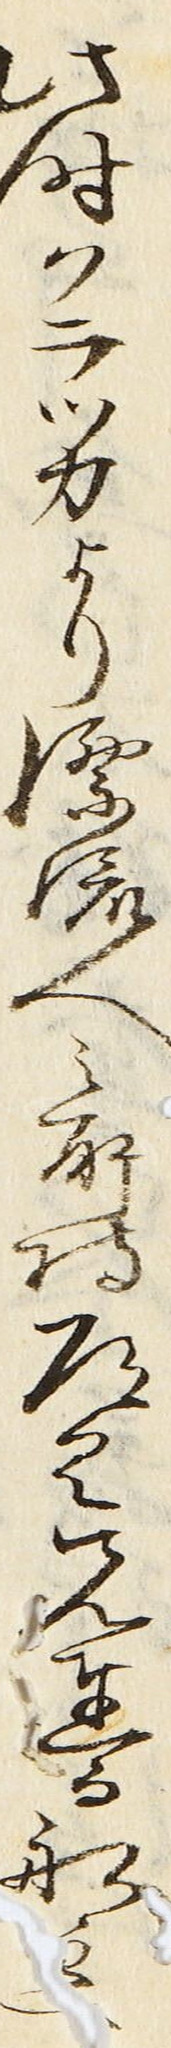此時クラツカより漂流人之所持道具先達而船
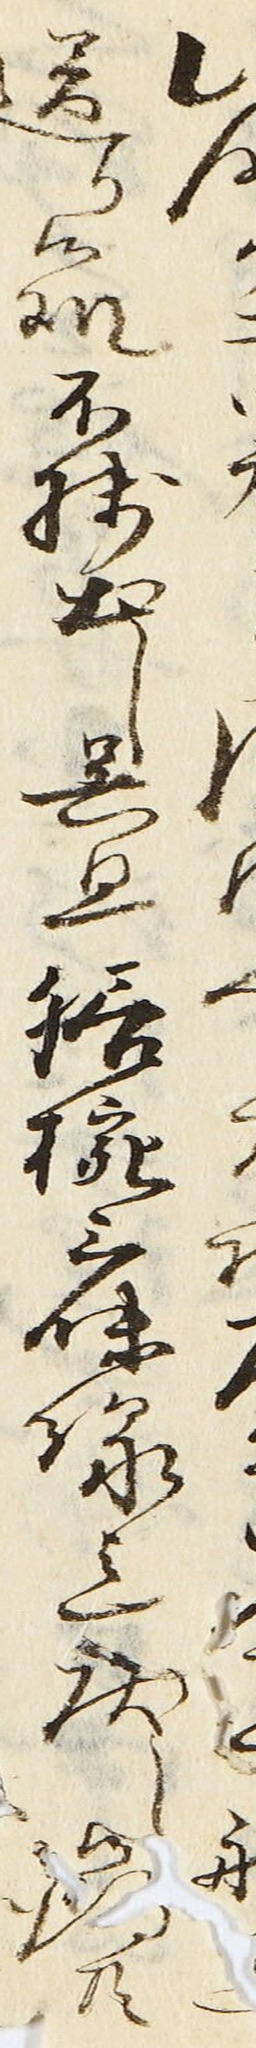送り候処不残出し呉且膳椀三味線迄戻し候得共
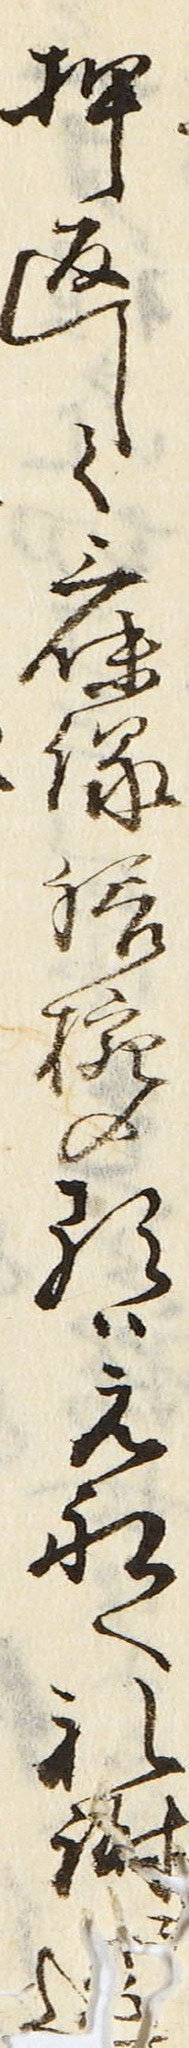押返して三味線膳椀の類ハ元船へ礼謝ニり
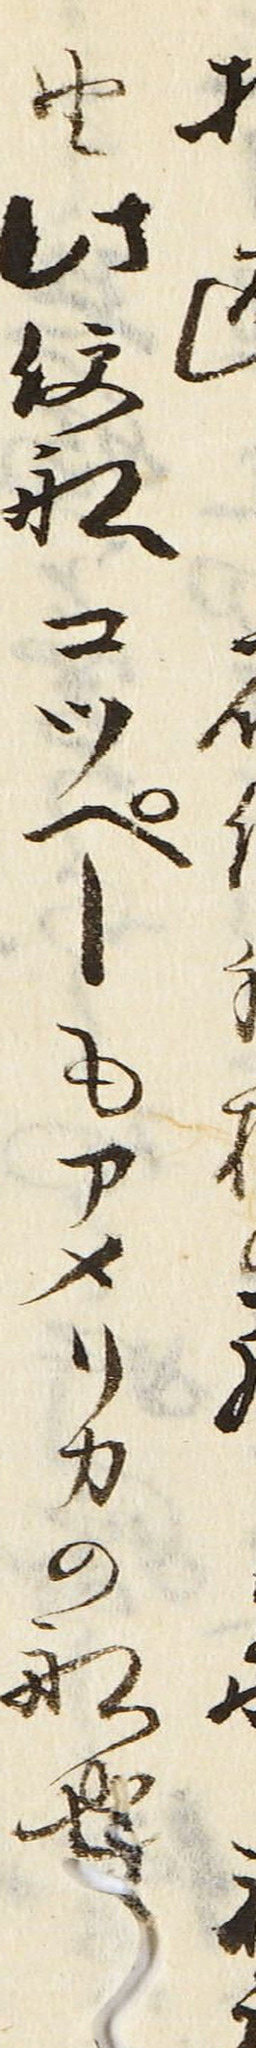由此便船コツペーもアメリカの船也
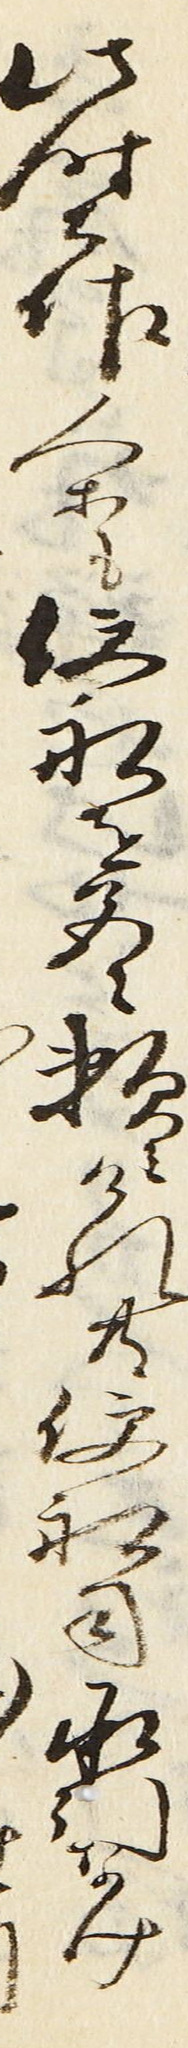此時土佐人等も便船を色々頼ミけれ共便船司承引なけ
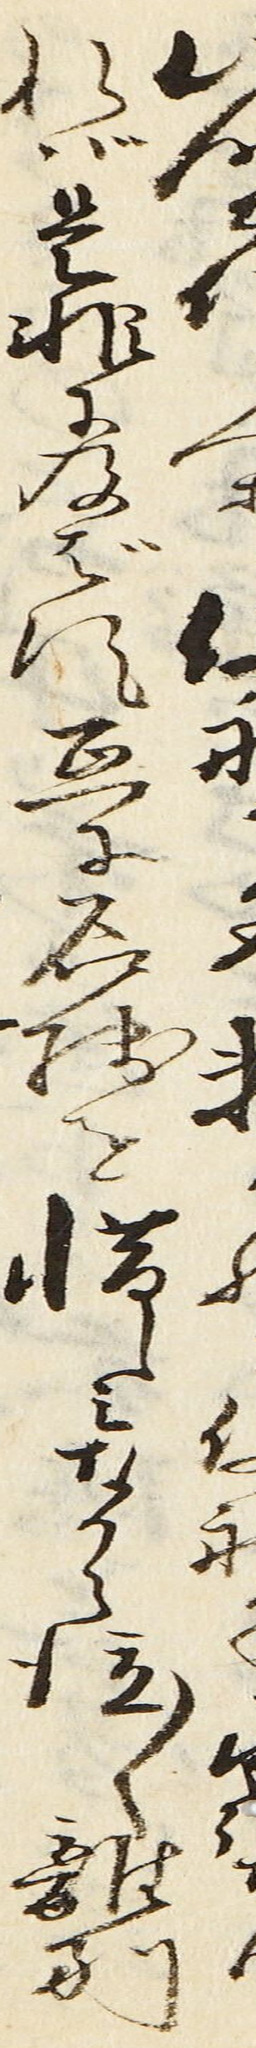れバ是非に及ばす互に名残を惜しミなから泣〳〵離別
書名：亜墨利加漂流記聞
